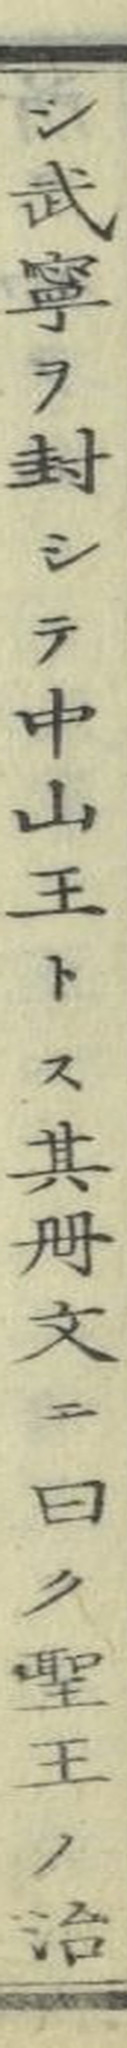シ武寧ヲ封シテ中山王トス其冊文ニ曰ク聖王ノ治
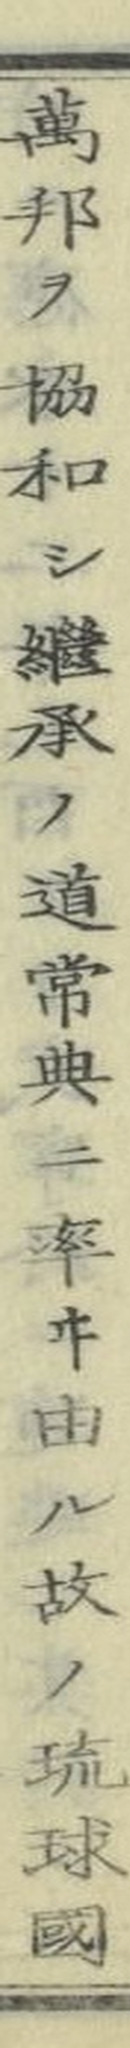萬邦ヲ協和シ繼承ノ道常典ニ率ヰ由ル故ノ疏球國
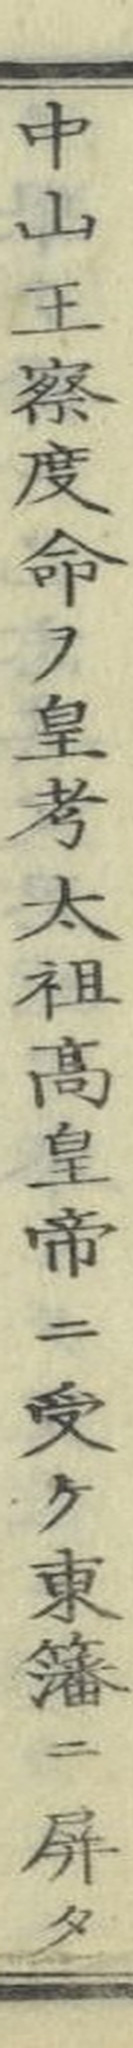中山王察度命ヲ皇考太祖高皇帝ニ受ケ東籓ニ屏タ
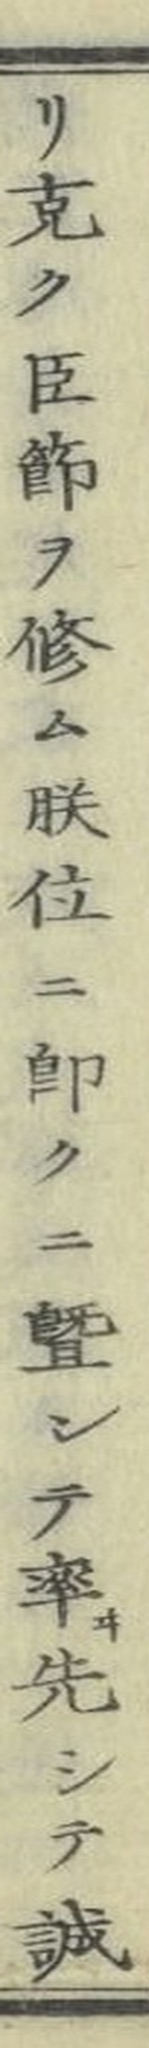リ克ク臣節ヲ修ム联位ニ即クニ曁ンテ率先シテ誠
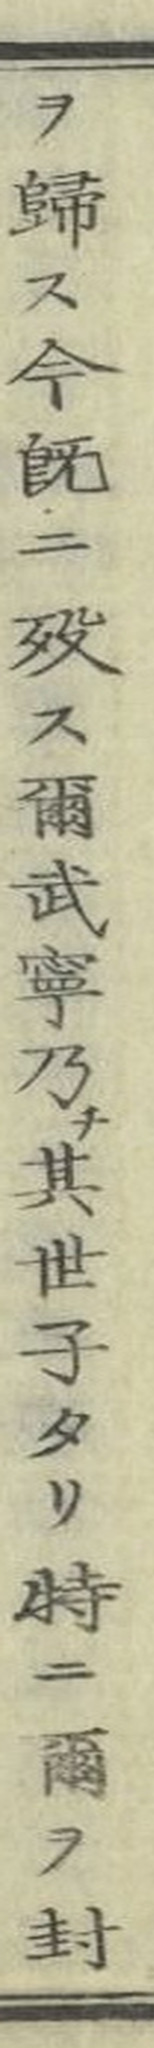ヲ歸ス今既ニ殁ス爾武寧乃其世子タリ特ニ爾ヲ封
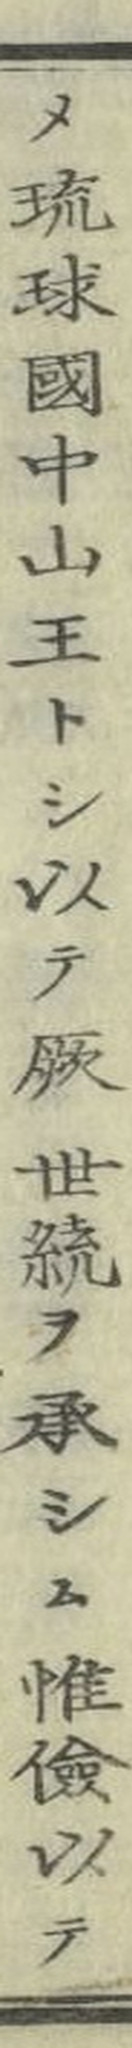シテ琉球國中山王トシ以テ厥世統ヲ承シム惟儉以テ
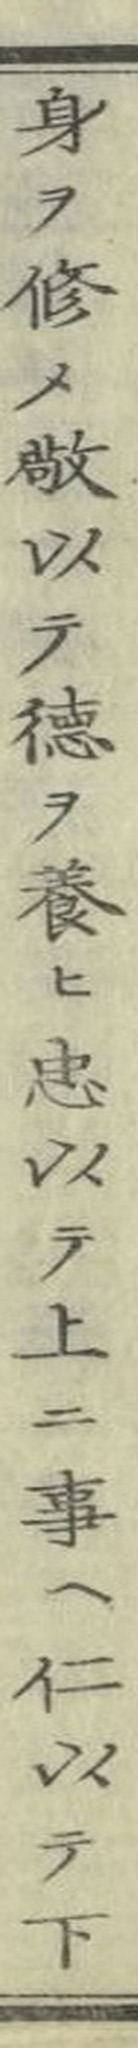身ヲ修メ敬以テ德ヲ養ヒ忠以テ上ニ事ヘ仁以テ下
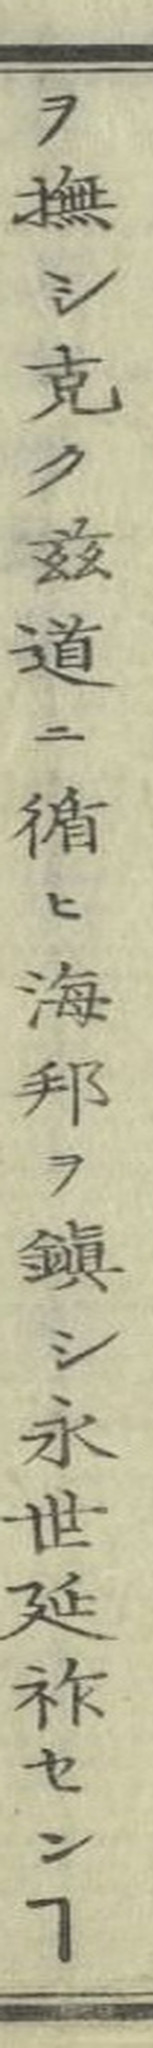ヲ撫シ克ク兹道ニ循ヒ海邦ヲ鎭シ永世延祚センコト
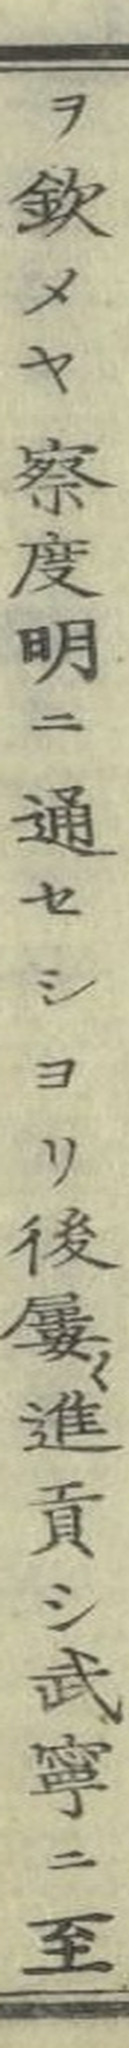ヲ欽メヤ察度明ニ通セシヨリ後屢〻進貢シ武寧ニ至
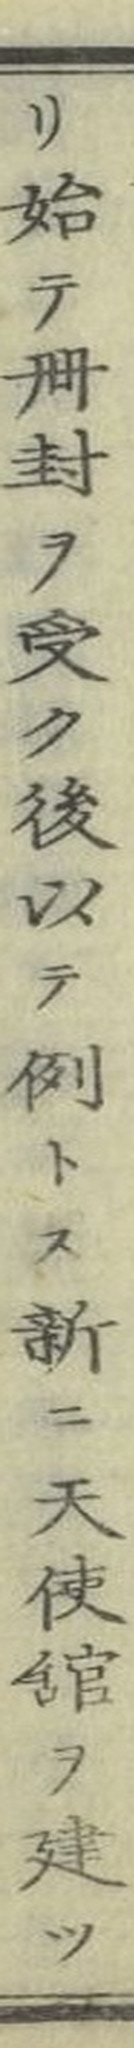リ始テ冊封ヲ受ク後以テ例トス新ニ天使舘ヲ建ツ

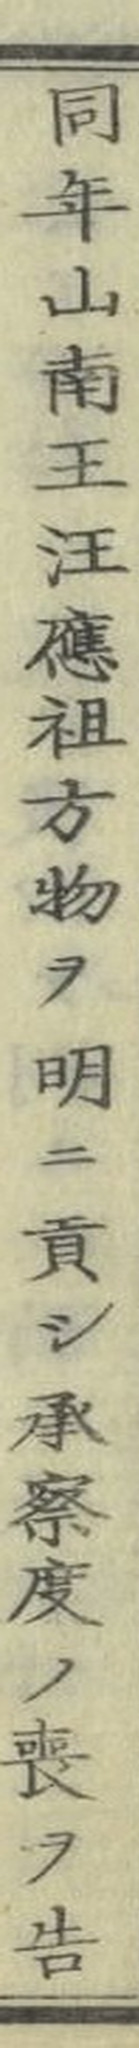同年山南王汪應祖方物ヲ明ニ貢シ承察度ノ喪ヲ告
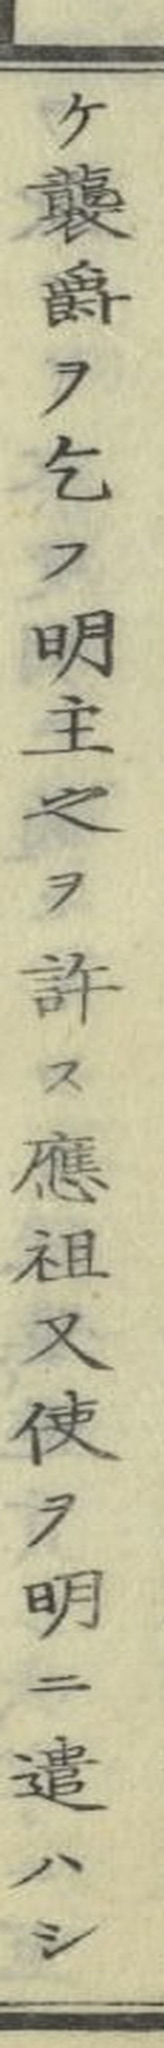ケ襲爵ヲ乞フ明主之ヲ許ス應祖又使ヲ明ニ遣ハシ
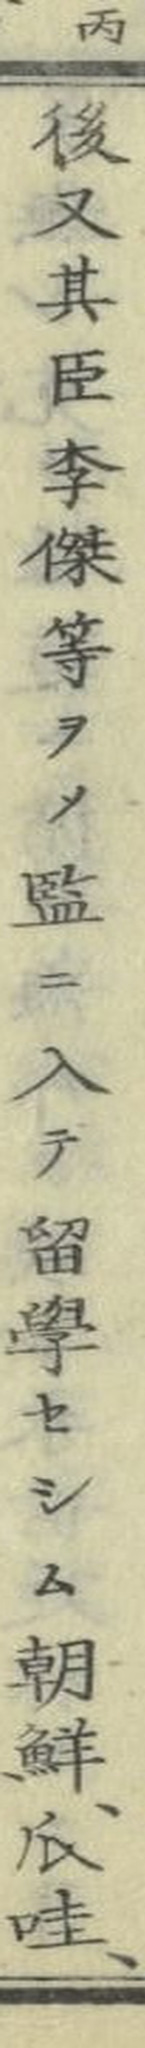後又其臣李傑等ヲシテ監ニ入テ留學セシム朝鮮、瓜哇、
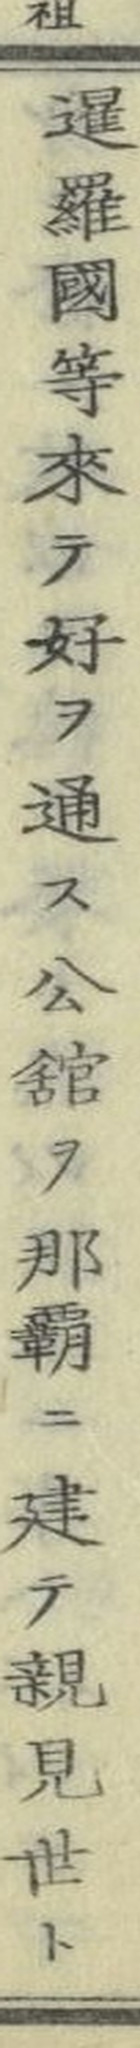暹羅國等來テ好ヲ通ス公舘ヲ那覇ニ建テ親見世ト
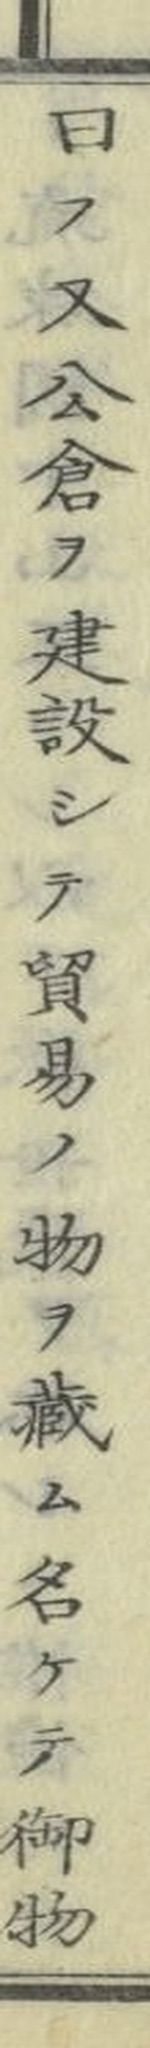曰フ又公倉ヲ建設シテ貿易ノ物ヲ藏ム名ケテ御物
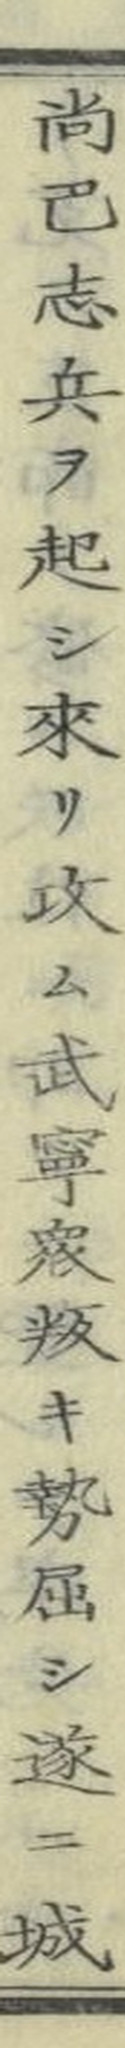尚巴志兵ヲ起シ來リ攻ム武寧衆叛キ勢屈シ遂ニ城
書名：琉球藩史 一之巻
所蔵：University of the Ryukyus Library
